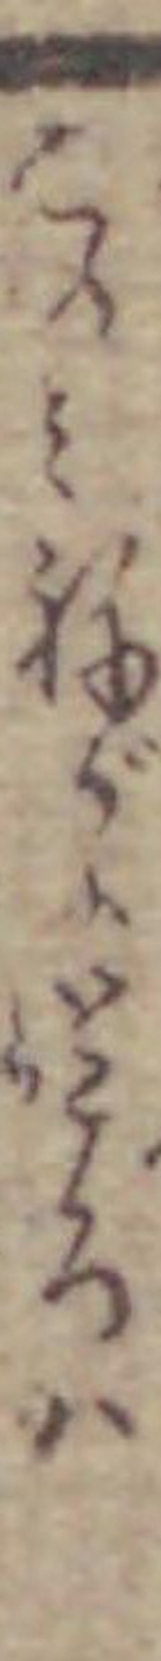このみねがふところは
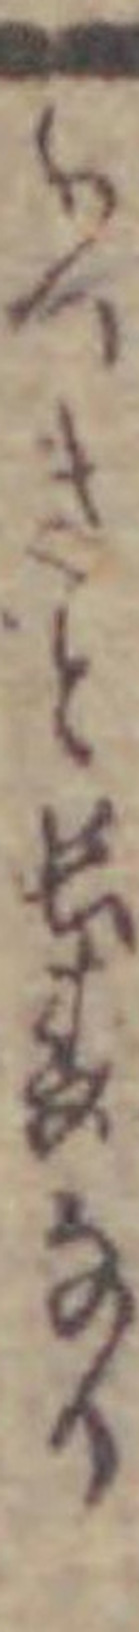ふつきと長寿なり
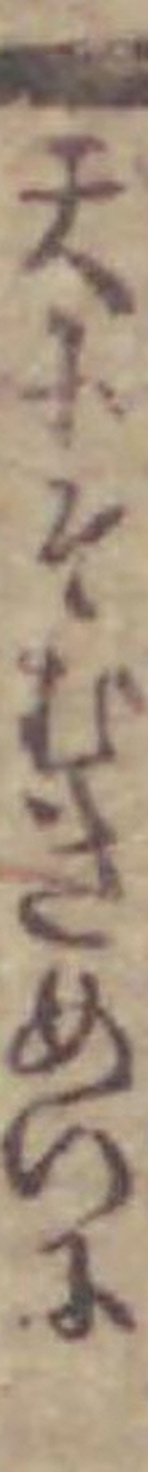天にそむきめいに
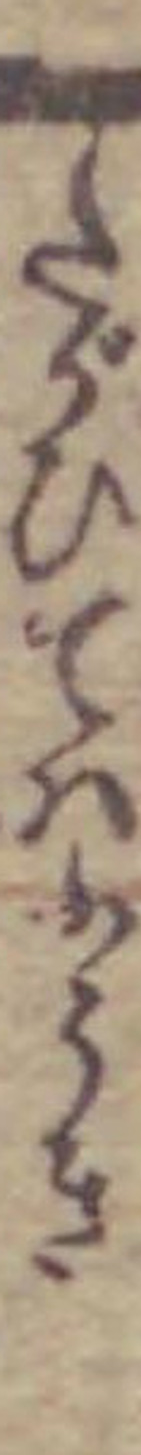たがひてはふうき
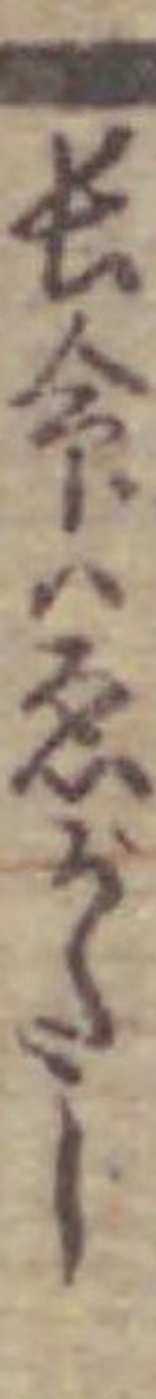長命はゑがたし
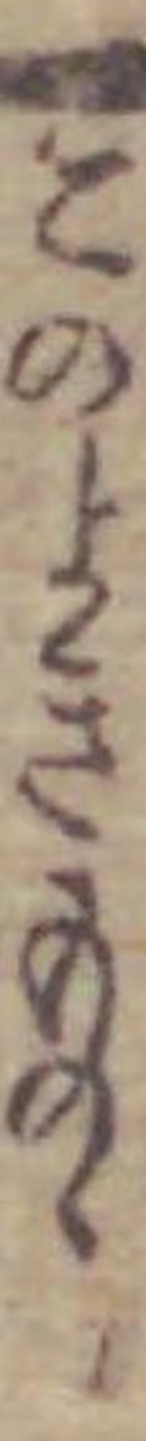このよきものゝ
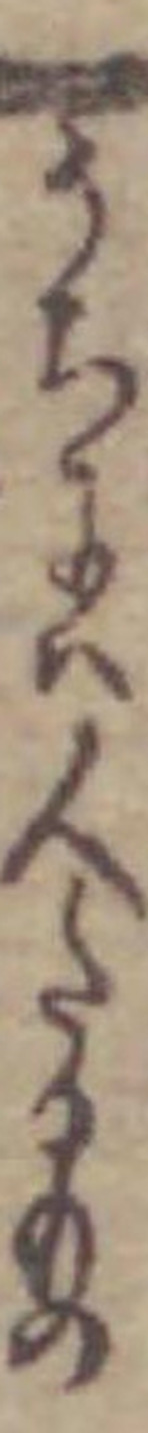うちには人たるもの
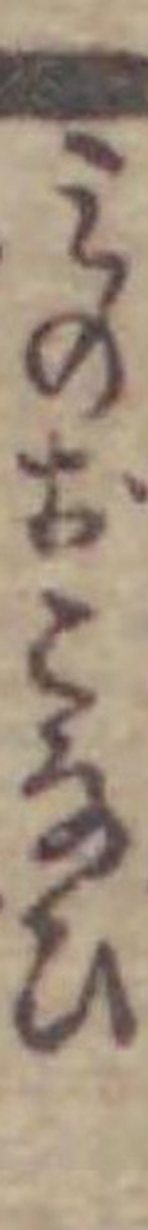みのおこなひ
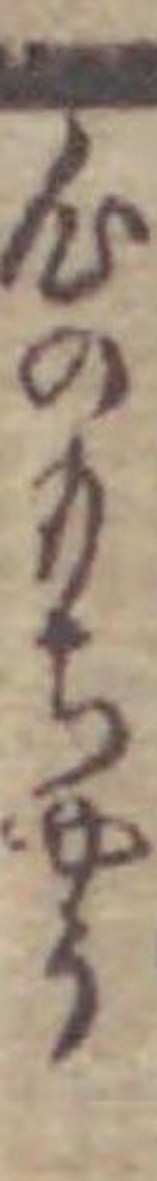心のもちやう
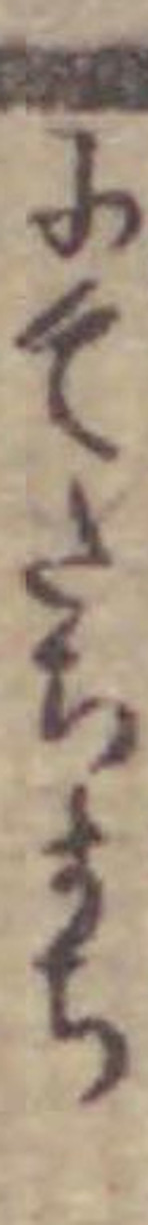にてたちまち
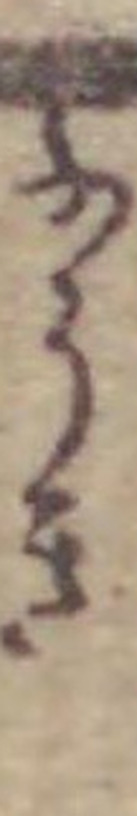ふうき
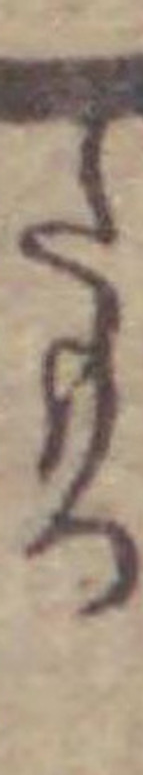たもつ
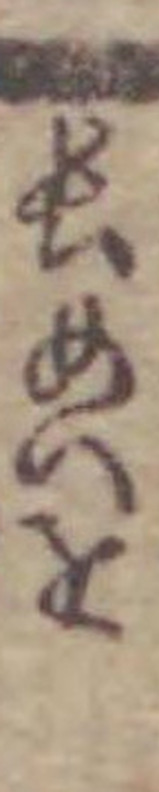長めいを
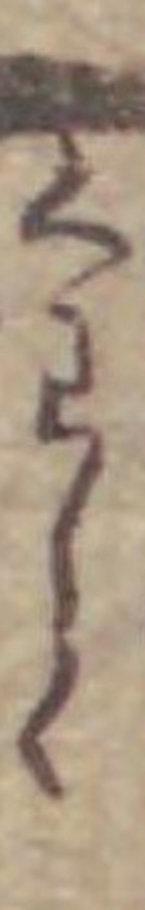くわしく
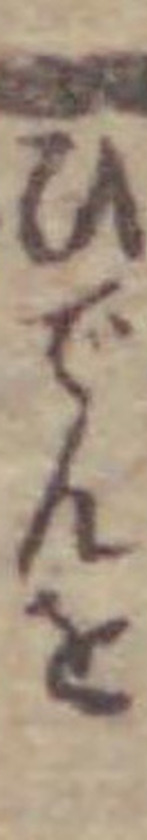ひでんを
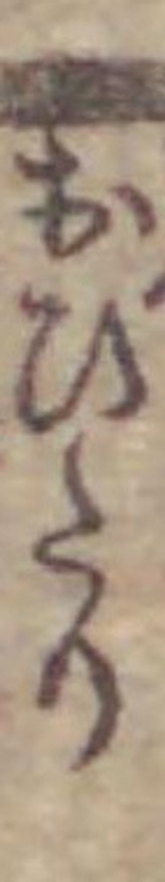おひたり
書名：和荘兵衛後日話 : 3巻
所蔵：国立国会図書館 National Diet Library, JAPAN
